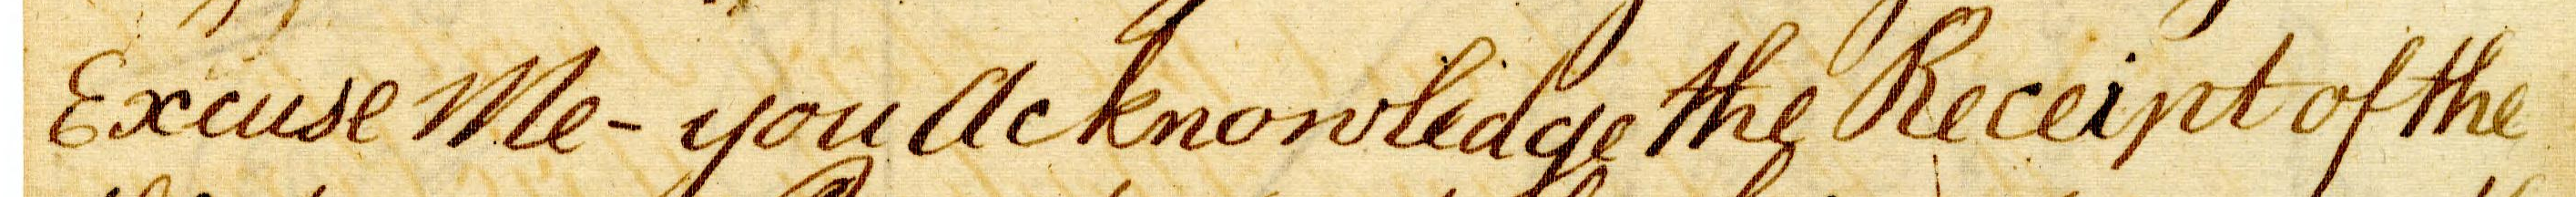Excuse Me-you Acknowledge the Receipt of the
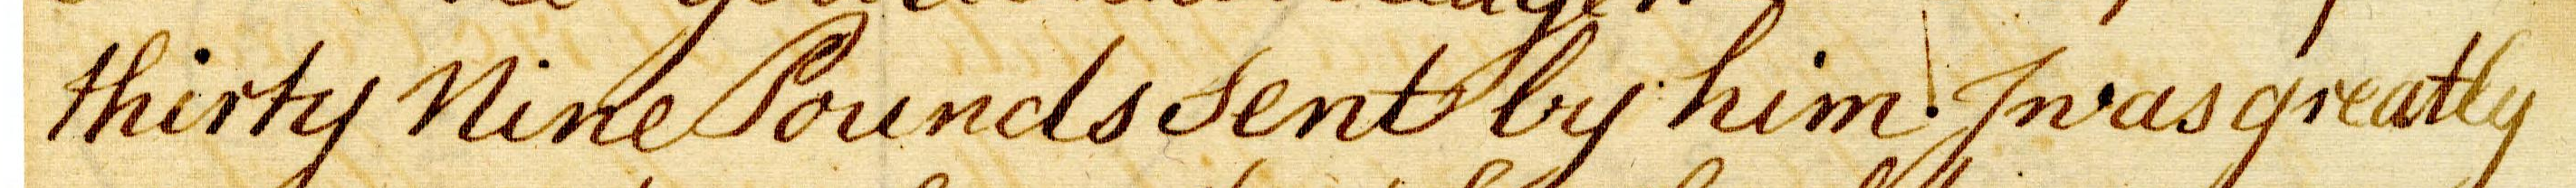thirty Nine Pounds sent by him. I was greatly
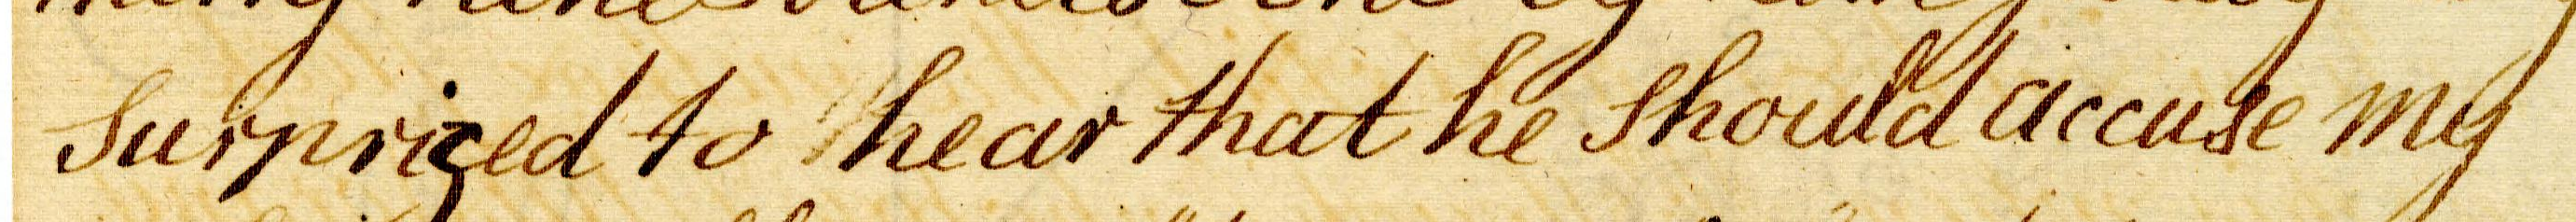Surprized to hear that he should accuse My
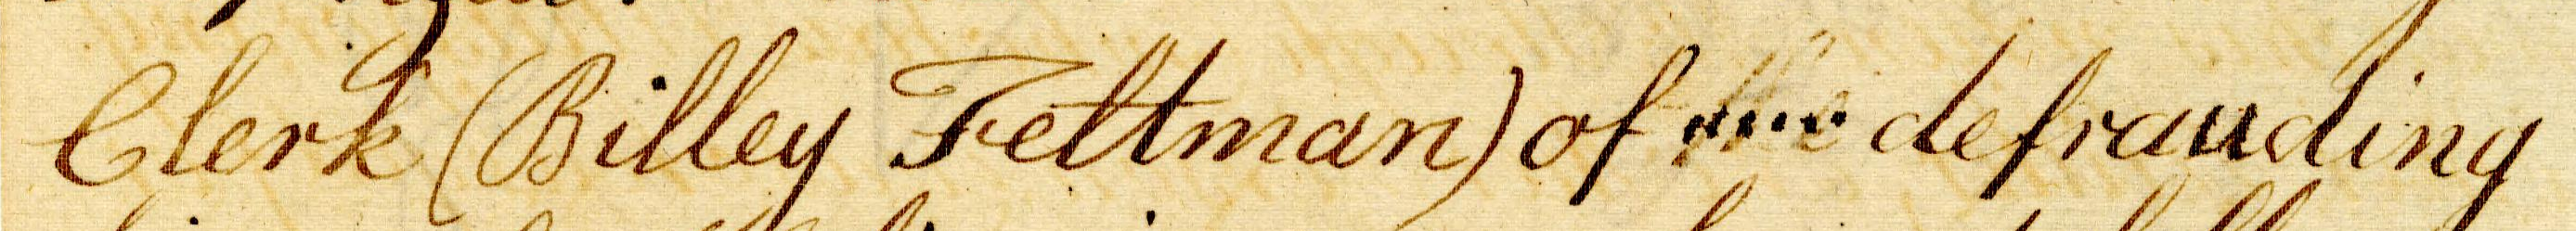Clerk (Billey Feltman) of [___] defrauding
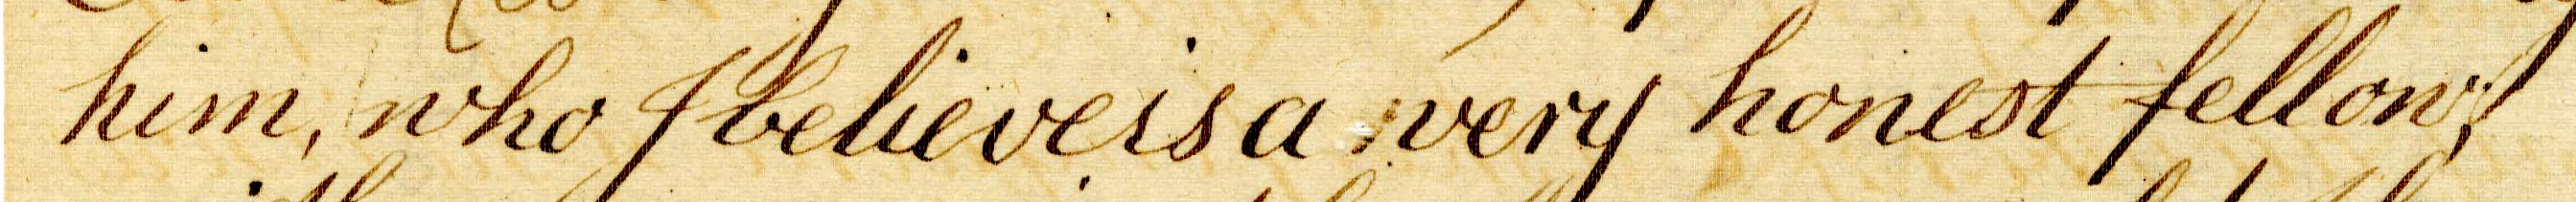him, who I believe is a very honest fellow;
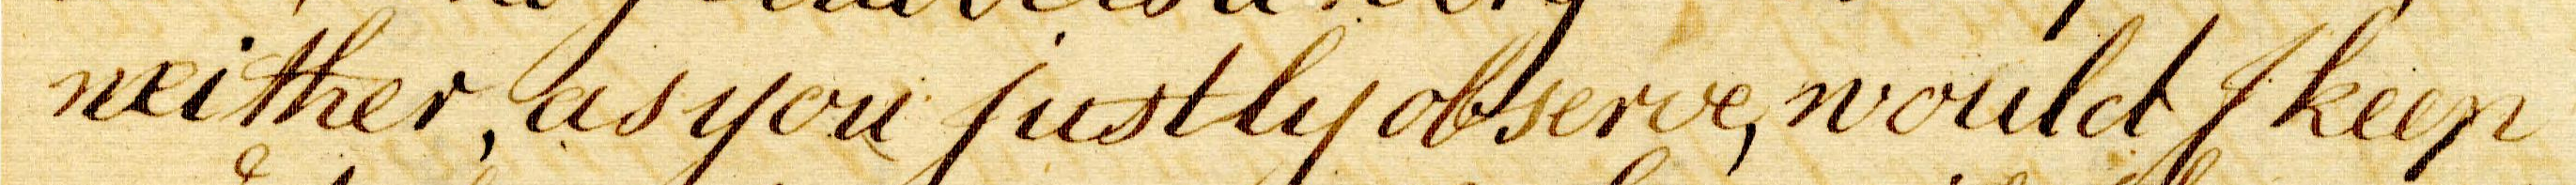neither, as you justly observe, would I keep
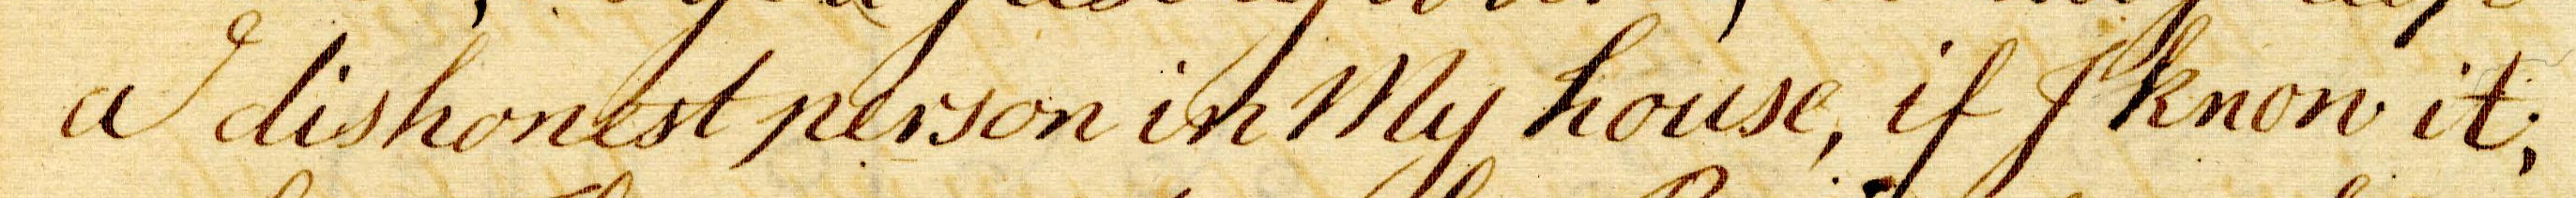I dishonest person in My house, if I know it;
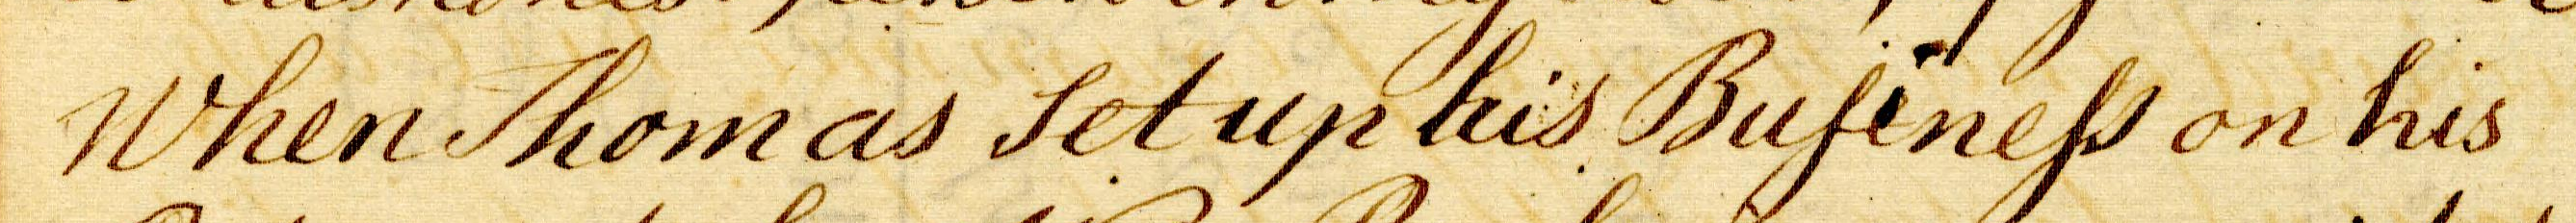When Thomas Set up his Business on his
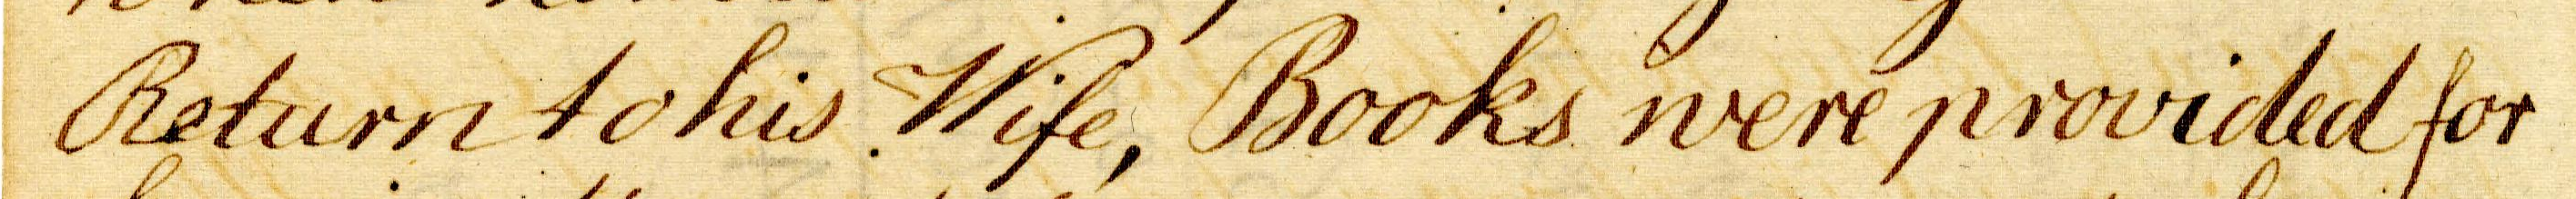Return to his Wife, Books were provided for
